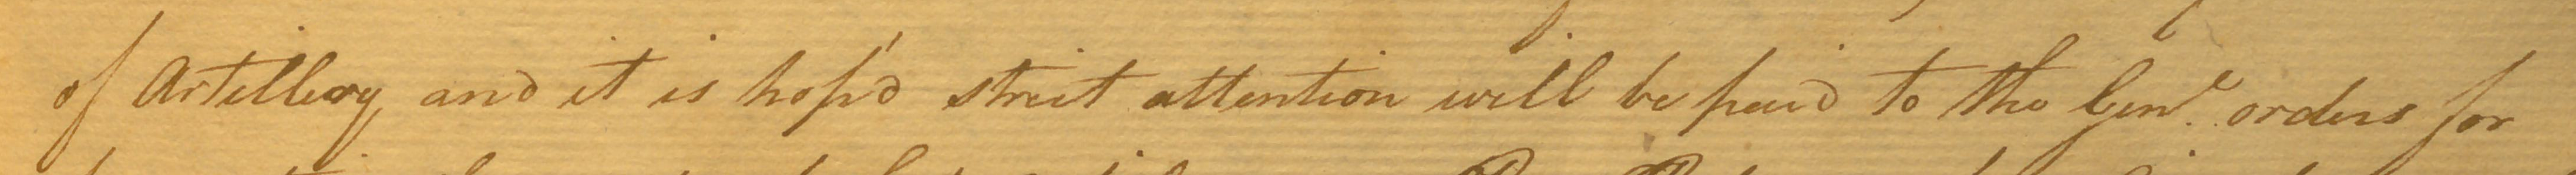of Artillery and it is hop'd strict attention will be paid to the Gen^l. orders for
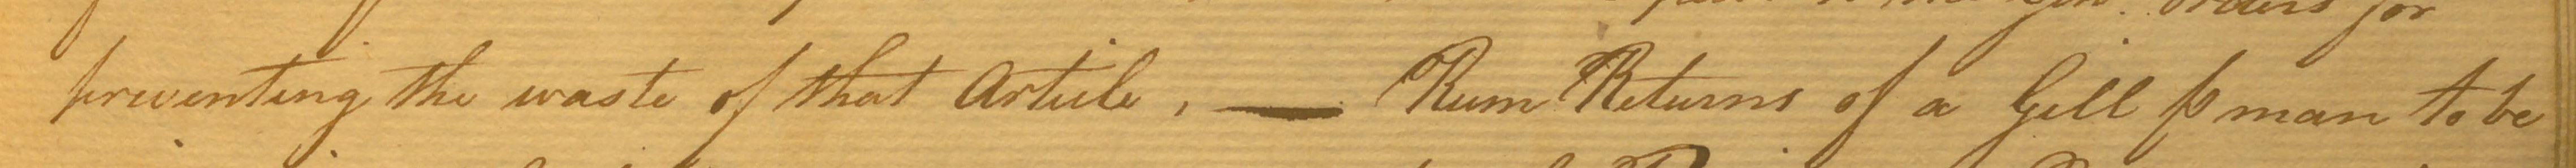preventing the waste of that Article.- Rum Returns of a Gill per man to be
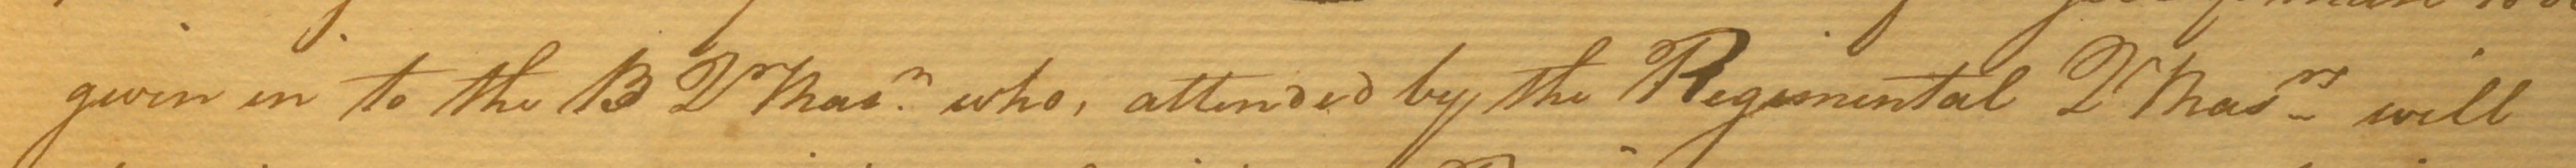given in to the B Q^r Mas^r. who, attnded by the Regimental Q^r Mas^rs. will
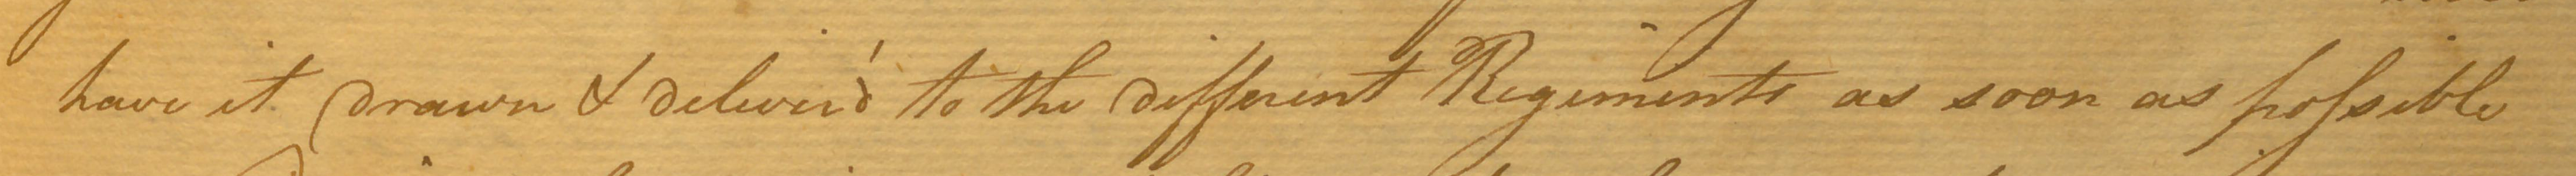have it drawn & deliver'd to the different Regiments as soon as possible
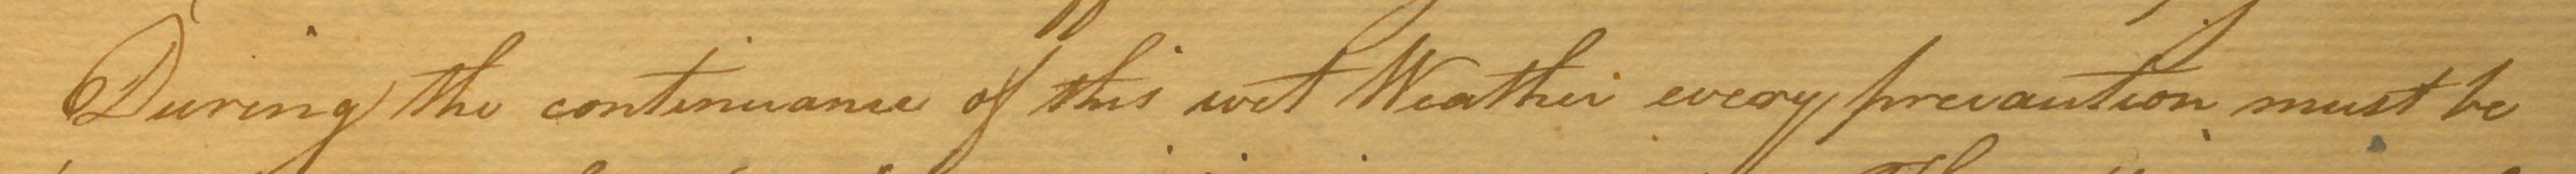During the continuance of this wet Weather every precaution must be
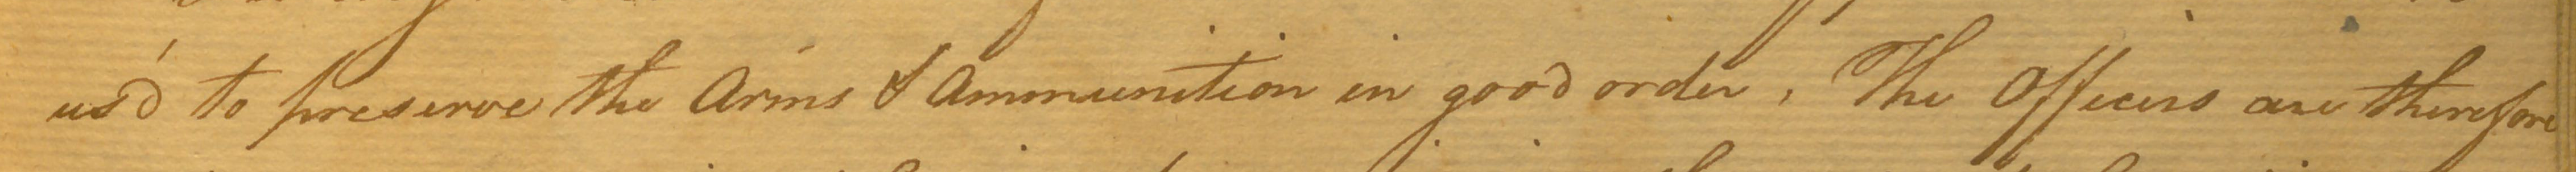us'd to preserve the Arms & Ammunition in good order. The Officers are therefore
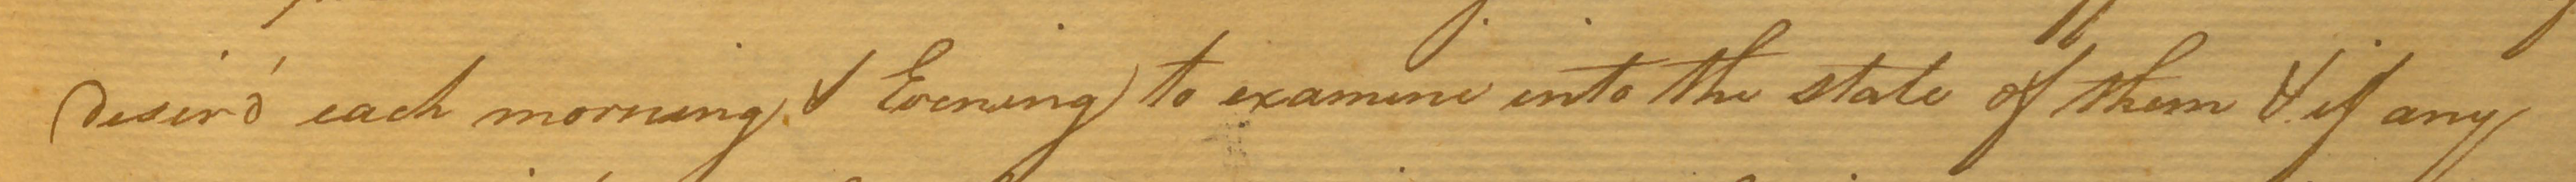desir'd each morning & Evening to examine into the state of them & if any
